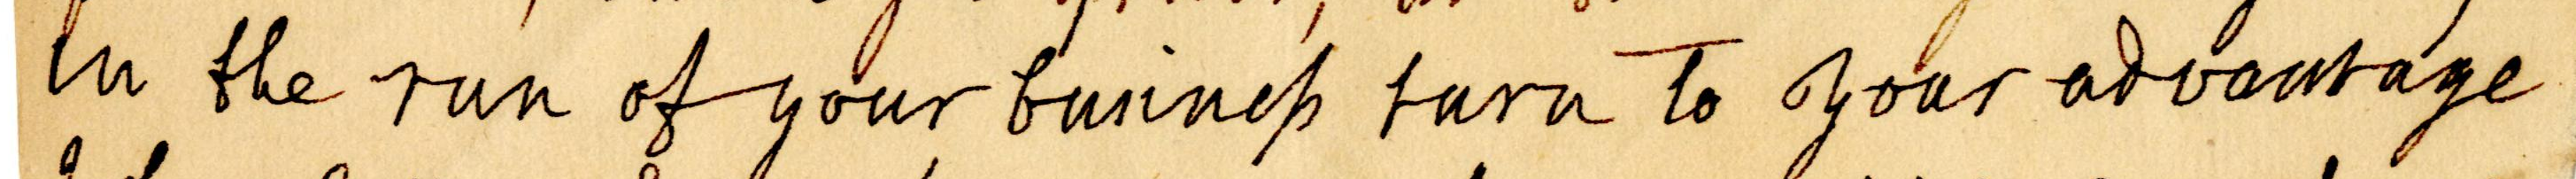in the run of your business turn to your advantage
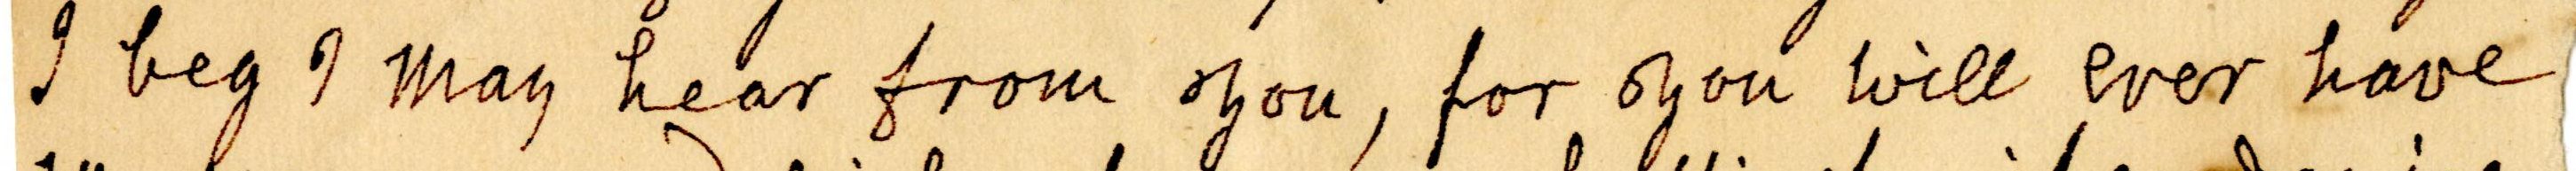I beg I may hear from you, for you will ever have
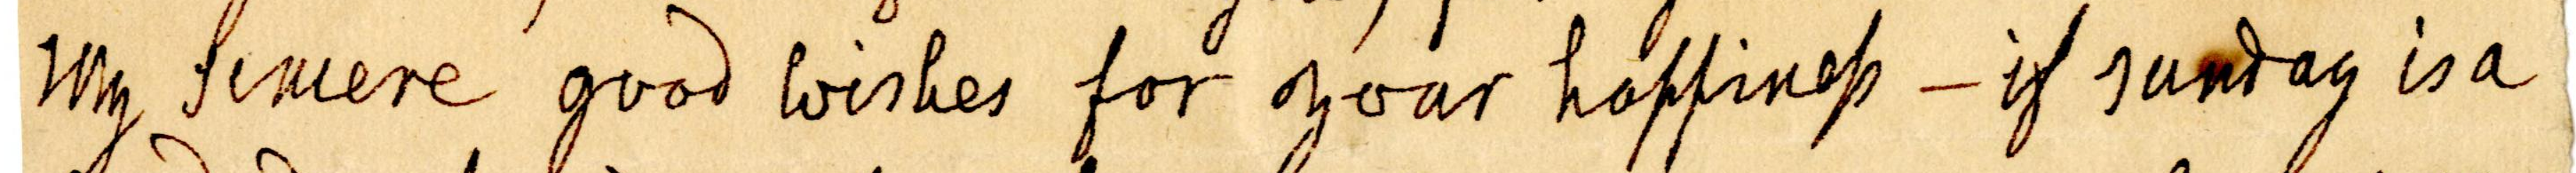my sincere good wishes for your happiness- if sunday is a
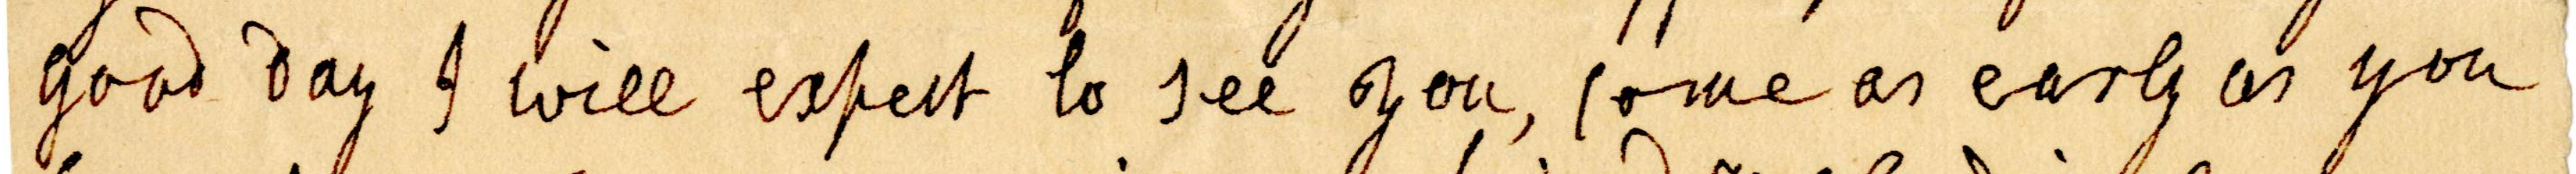good day I will expect to see you, come as early as you
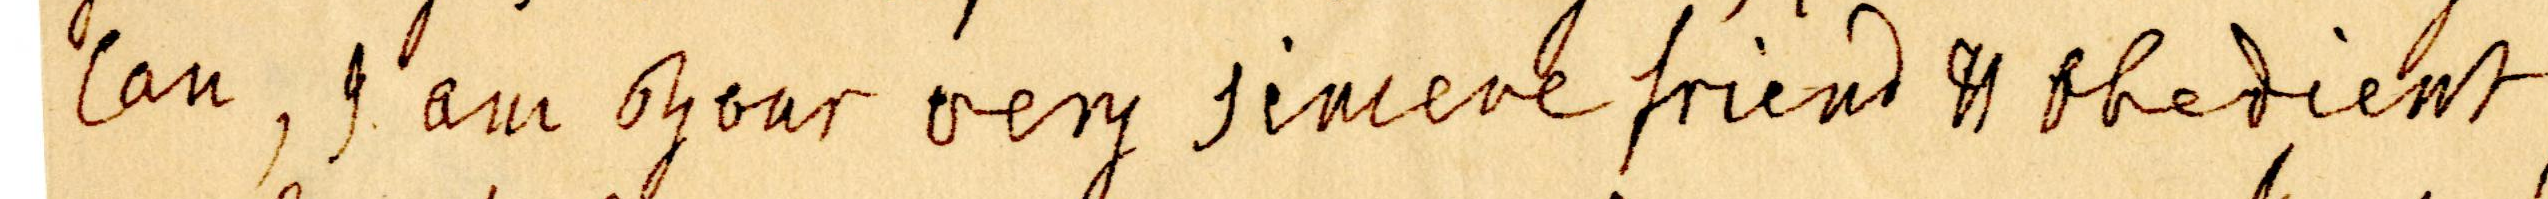can, I am your very sincere friend & obedient
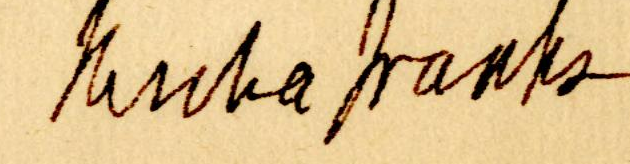Moses Franks
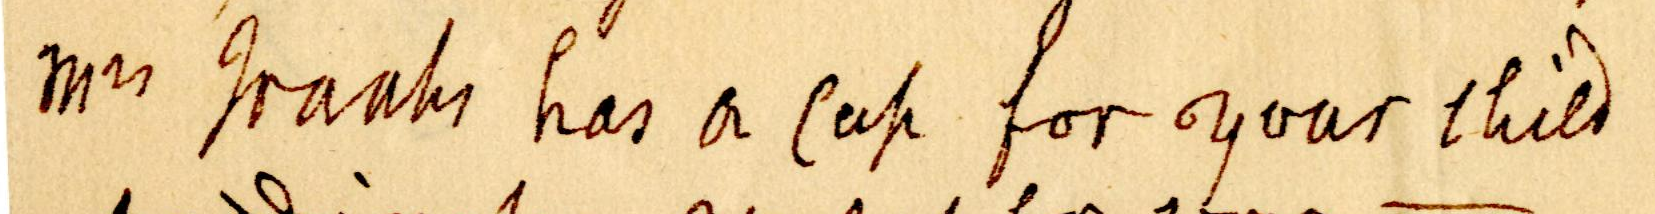M^rs Franks has a cap for your child
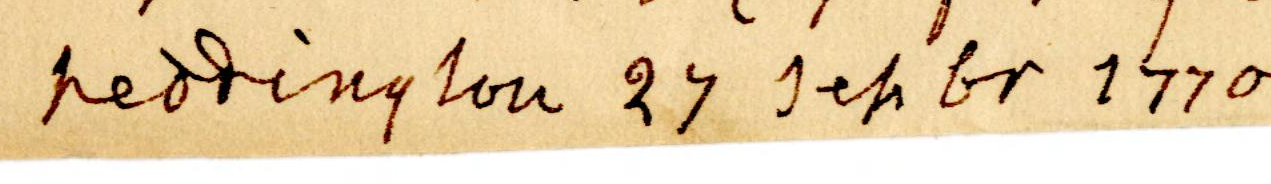heddington 27 Sepbr 1770
